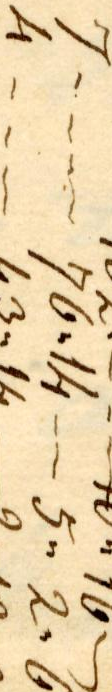7- - - - 76.. 14 - - 5.. 2.. 6.
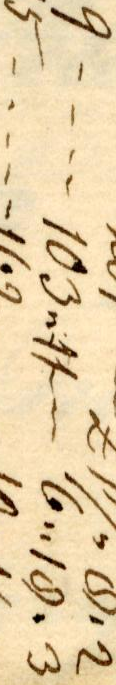9 - - - - 103.. 11 - - - 6.. 18.. 3
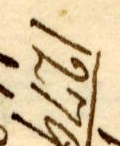1279
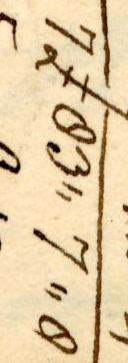7 £93.. 7.. 8
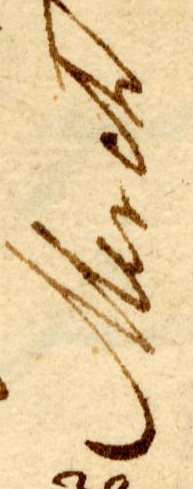Merch^t.
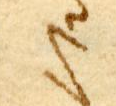in
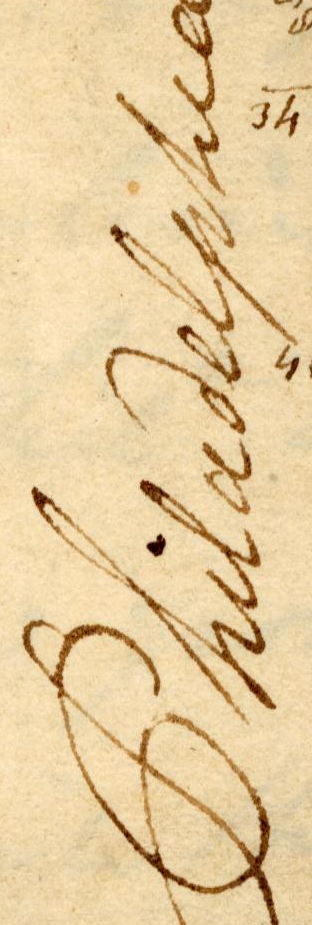Philadelphia
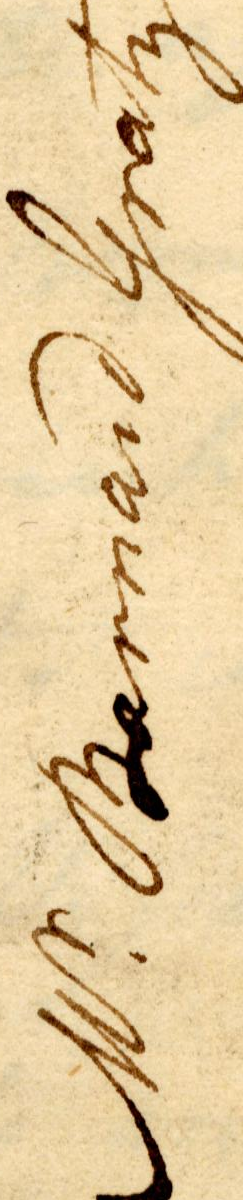M^r. Barnard Gratz
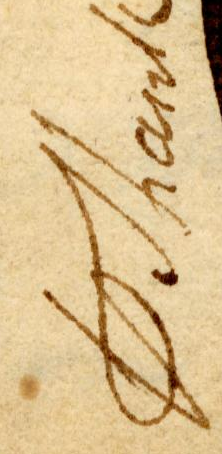per Shank
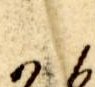96
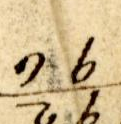192
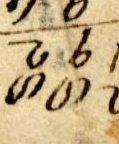200
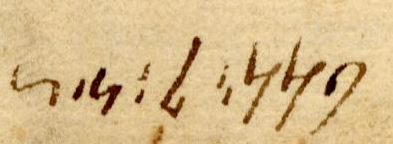644.. 7; 414
